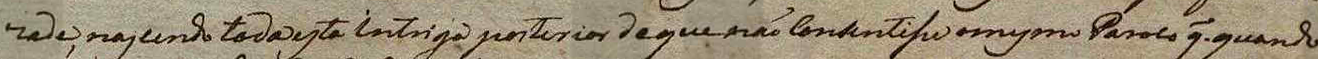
zade, nascendo toda esta intriga posterior de que naõ consentisse o mesmo Paroco q̄ quando
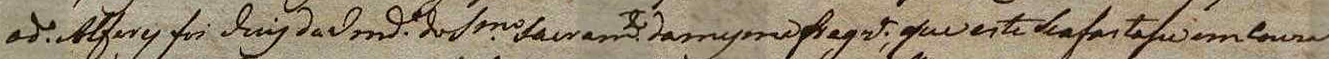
o d.o Alferes foi Iuis da Irmd.e do S.mo Sacram.to da mesma fregz.a que este se afastasse em couza
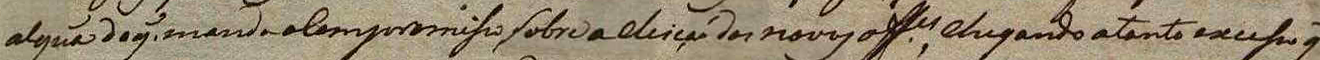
algūa do q̄ manda o Compromisso, sobre a eleiçaõ dos novos off.es, chegando a tanto excesso q̄
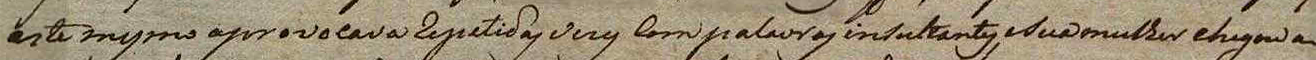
este mesmo o provocava Repetidas vezes Com palavras insultantes, e sua mulher chegou ao
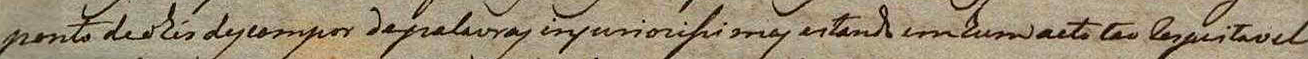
ponto de o hir descompor de palavras injuriozissimas estando com hum acto tao Respeitavel
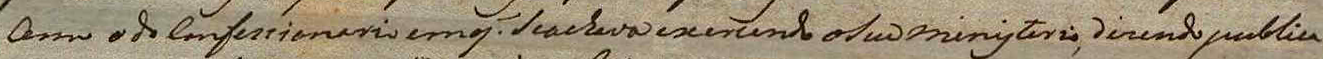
Como o do Confessionario em q̄ se achava exercendo o seu ministerio, dizendo publica
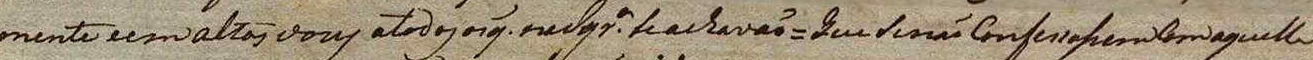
mente e em altos vozes a todos os q̄ na Igr.a se achavaõ = Que senaõ Confessassem Com aquelle
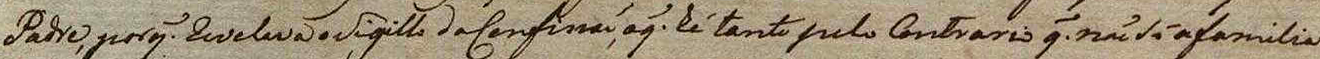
Padre, porq̄ Revelava o Sigillo da Confissaõ, o q̄ hé tanto pelo Contrario q̄ naõ só a familia
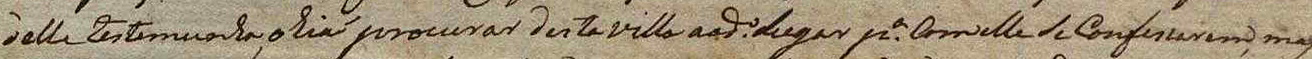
delle testemunha, o hiaõ procurar desta villa ao d.o Lugar p.a Com elle se Confessarem, mas
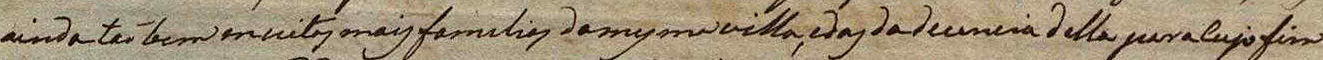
ainda tãobem muitas mais familias da mesma villa, e das da deuncia della para Cujo fim
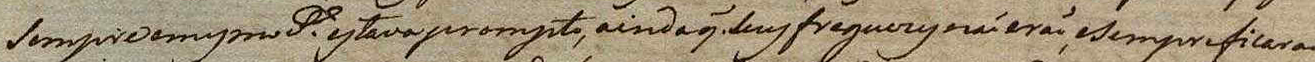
sempre e mesmo P.e estava prompto, ainda q̄ seus freguezes naõ eraõ, e sempre ficaraõ
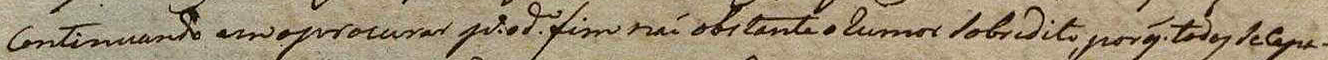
continuando em o procurar p.o o d.o fim naõ obstante o Rumor sobredito, porq̄ todos se capa
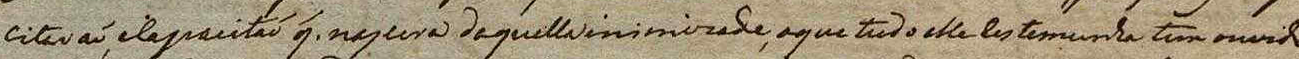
citavaõ, e capacitaõ q̄ nascera daquella inimizade, o que tudo elle testemunha tem ouvido
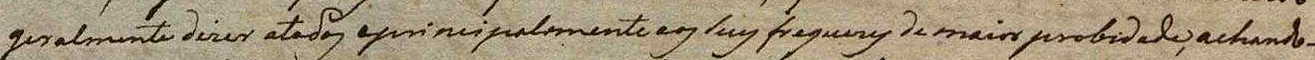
geralmente dizer a todos e principalmente aos seus freguezes de maior probidade, achando
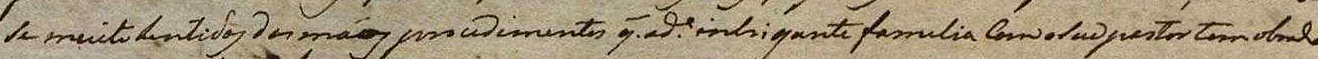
se muito sentidos das maõs procedimento q̄ o d.o intrigante familia Com o seu pastor tem obrado
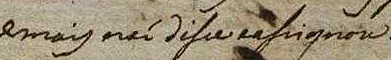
e mais naõ disse e assignou.
